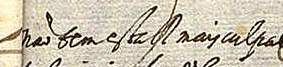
naõ tem esta R mais culpas
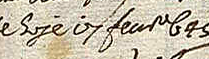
_te hoje i7 feuro 645
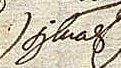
sjlua
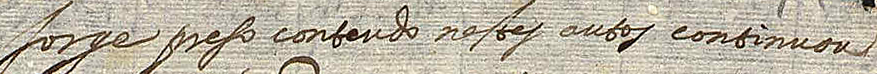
Jorge preso conteudo nestes autos continuou
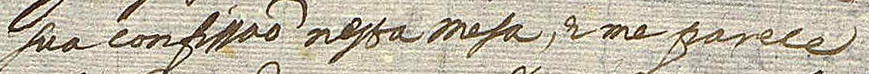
sua confissaõ nesta mesa, E me parece
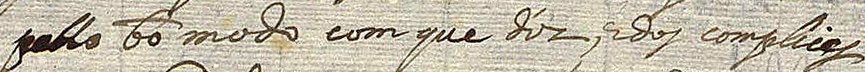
pello bō modo com que díz, E dos complices
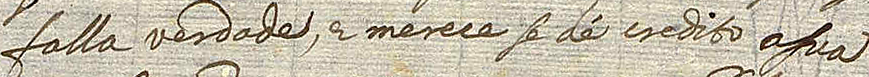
falla verdade, E merece se dé credito a sua
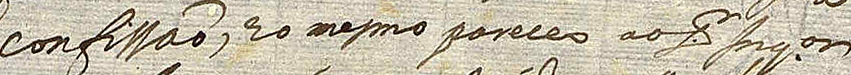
confissaõ, E o mesmo pareceo ao s.r Jnq.or
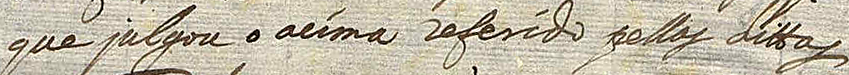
que julgou o acima referido pellas dittas
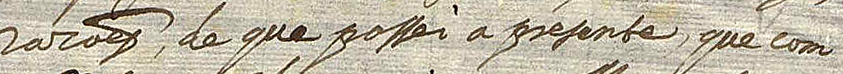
razoēs, de que passei a presente, que com
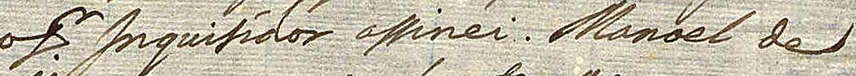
o s.r Jnquisidor assinei. Manoel de
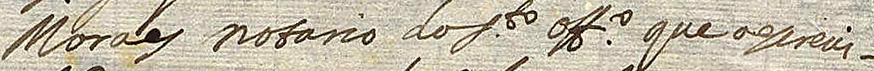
Moraes notario do s.to off.o que o escreui
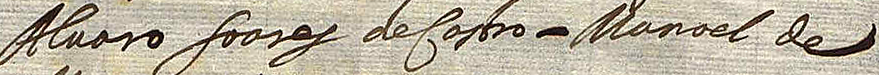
Aluaro soares de Castro - Manoel de
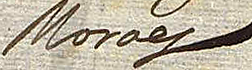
Moraes
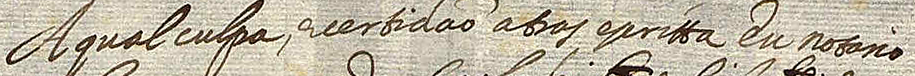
A qual culpa, E certidão atras escritta eu notario
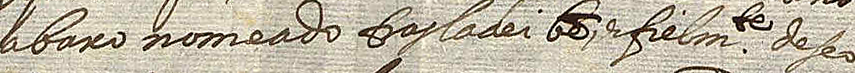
abaxo nomeado trasladei bē, E fielm.te de seo
